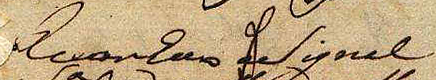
Reconheço o Signal
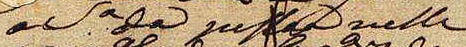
e S.o da pessa nelle
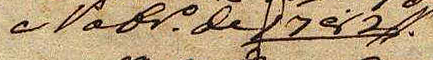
Nobr.o de 1782//.
